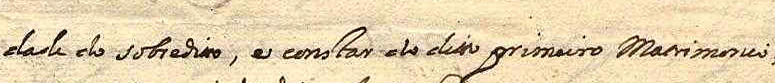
dade do sobredito, e constar do dito primeiro Matrimonio,
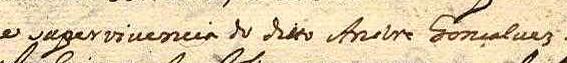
e superviuencia do ditto Andre Gonçaluez.
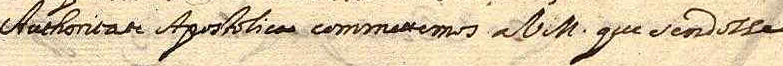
Authoritate Apostolica commettemos a V M. que sendosse
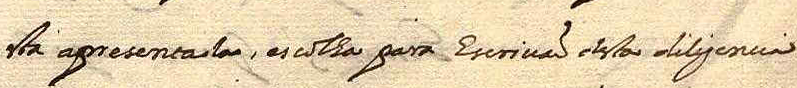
esta apresentada, escolha para Escriuaõ desta diligencia
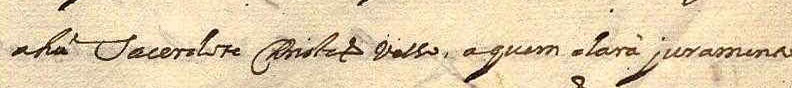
a hū Sacerdote Christaõ Velho, a quem dará juramento
